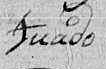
tuado
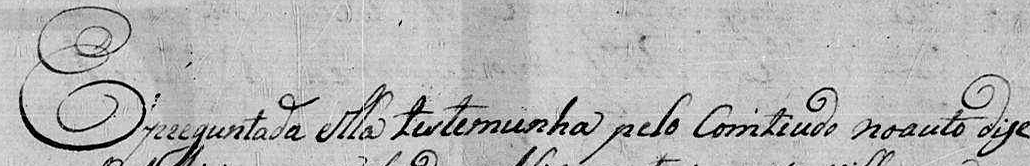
E preguntada ella testemunha pelo Comteudo no auto dise
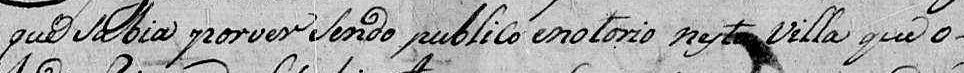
que sabia por ver sendo publico e notorio nest_ Villa que o
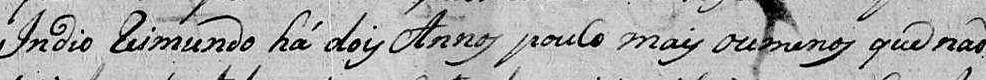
Indio Reimundo há dois Annos pouco mais ou menos que naõ
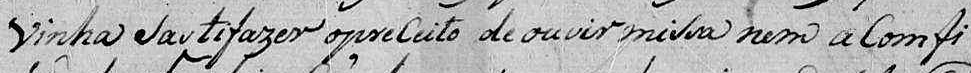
vinha Sastifazer o preCeito de ouvir missa nem a Comfi
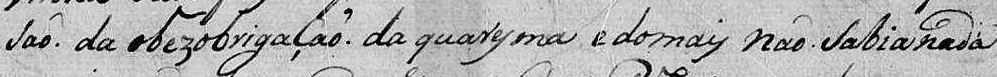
saõ. da obezobrigaÇaõ. da quaresma, e do mais naõ sabia nada
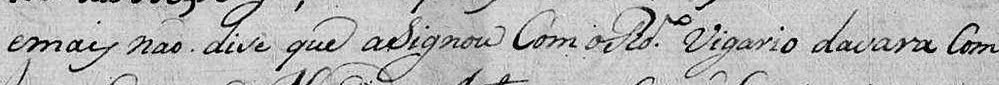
e mais naõ dise que aSignou Com o Rd.o Vigario da vara Com
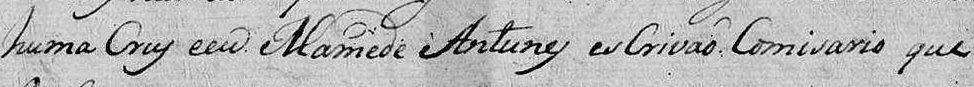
huma Crus e eu Mamede Antunes esCrivaõ Comisario que
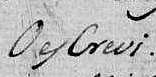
O esCrevi.
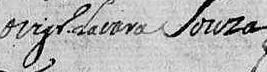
o vigr.o da vara Souza
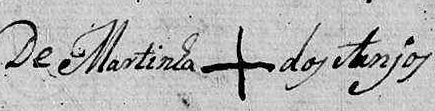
De Martinho + dos Anjos
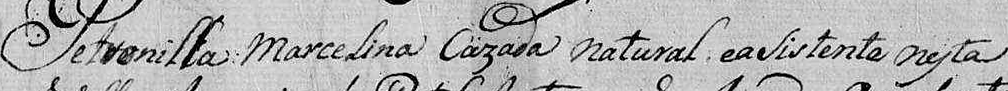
Petronilha Marcelina Cazada natural e asistente nesta
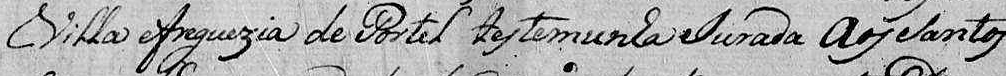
Villa e freguezia de Portel testemunha Iurada Aos Santos
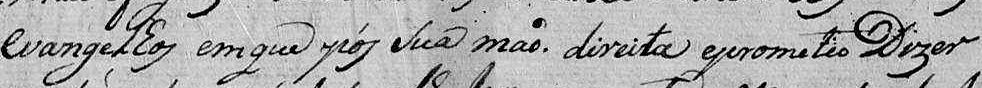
evangelhos em que pos sua maõ. direita e prometeo Dizer
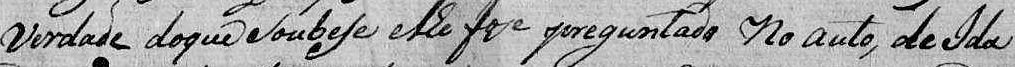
verdade do que soubese, e lhe fose preguntado no auto, de Ida
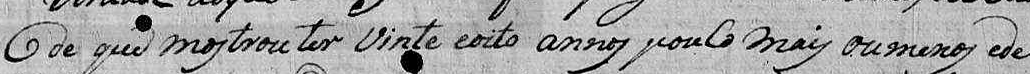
de que mostrou ter vinte e oito annos pouco mais ou menos, e de
